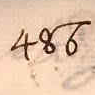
486
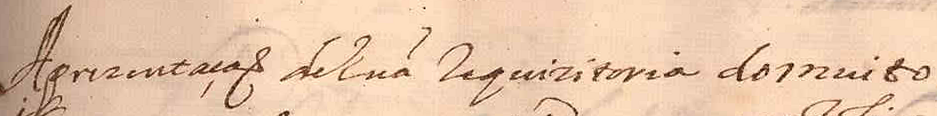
Aprezentaçaõ de huā Requizitoria do muito
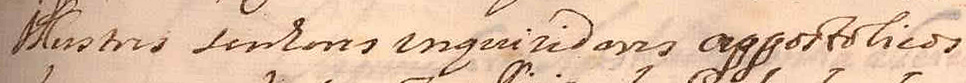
Illustres senhores inquizidores appostolicos
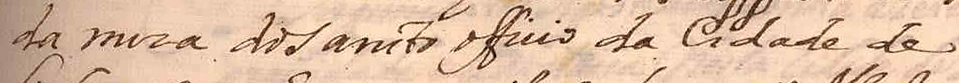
da meza do Sancto officio da Cidade de
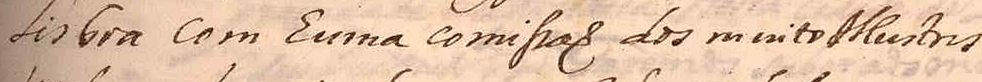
Lisboa com huma comissaõ dos muito Illustres
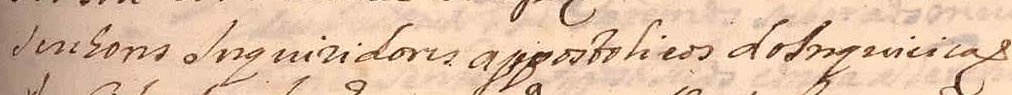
senhores Inquizidores appostolicos do Inquiziçaõ
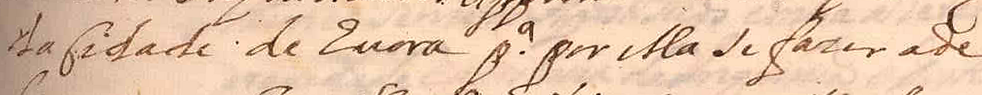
da Cidade de Euora p.a por ella se fazer a de
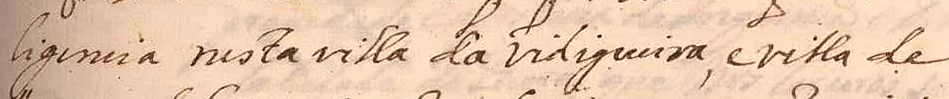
ligencia nesta villa da vidigueira, e villa de
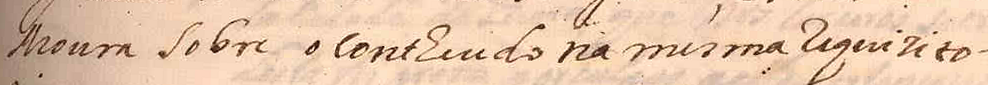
Moura sobre o contheudo na mesma Requizito
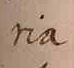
ria
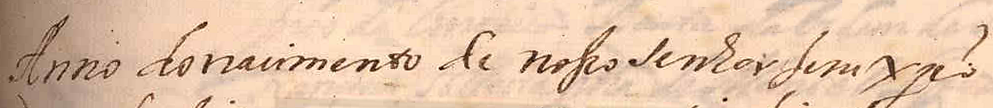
Anno do nacimento de nosso senhor Jesu xpō
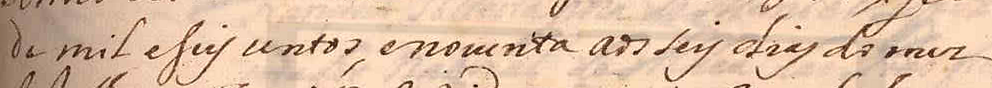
de mil e seiscentos, e nouenta aos seis dias do mez
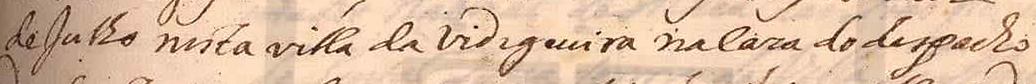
de Julho nesta villa da Vidigueira na Caza do despacho
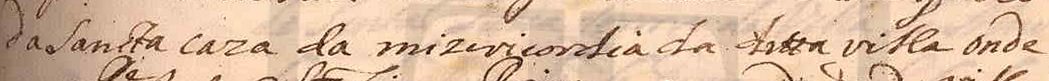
da Sancta caza da mizericordia da ditta villa onde
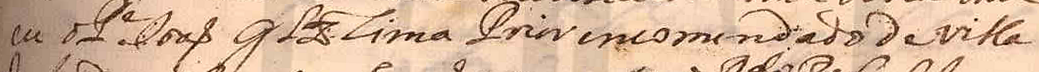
eu o P.e Ioaõ Glz̄ Lima Prior encomendado de villa
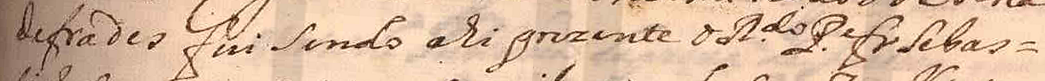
de frades fui sendo ahi prezente o R.do P.e fr. Sebas
